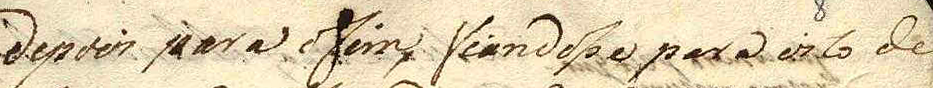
depois para o fim, ficandosse para isto de
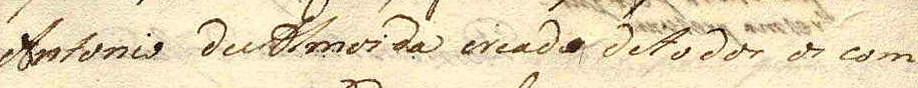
Antonio de Almeida creado de todos os com
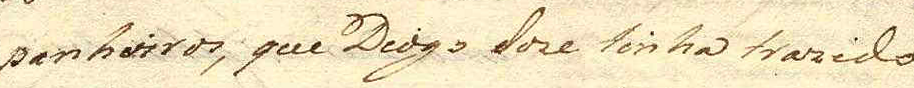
panheiros, que Diogo Ioze tinha trazido
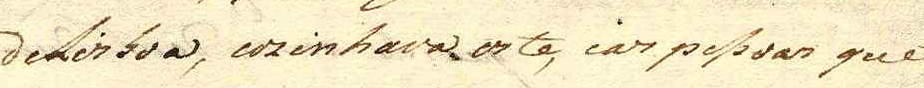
de Lisboa, cozinhava este, e as pessoas que
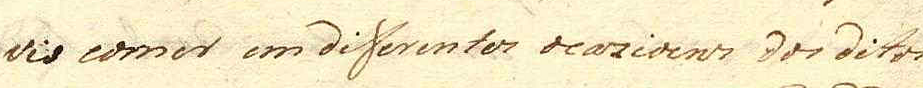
vio comer em diferentes ocazioens dos ditos
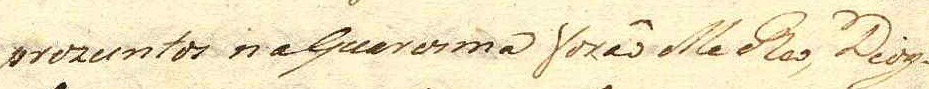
prezuntos na Quaresma foraõ elle Reo, Diogo
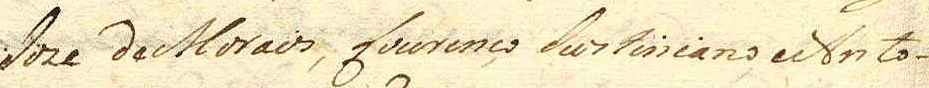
Ioze de Morais, Lourenço Iustiniano e Anto
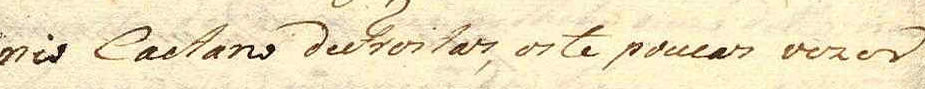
nio Caetano de Freitas, este poucas vezes
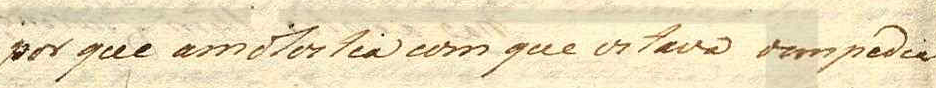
porque a moLestia com que estava o empedia
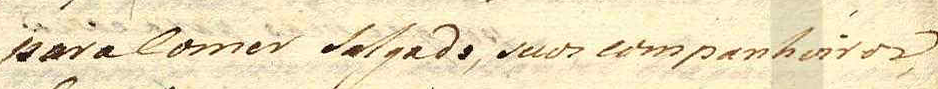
para Comer Salgado, seus complanheiros,
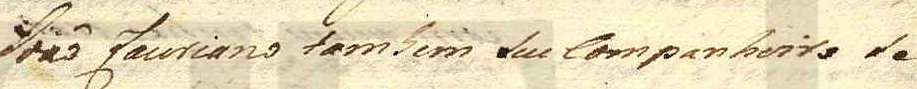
Ioaõ Lauriano tambem seu Companheiro se
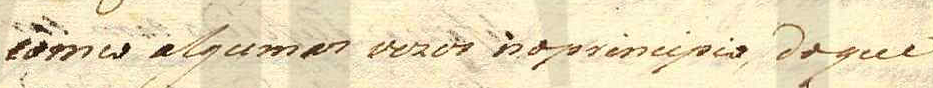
comeo algumas vezes no principio, do que
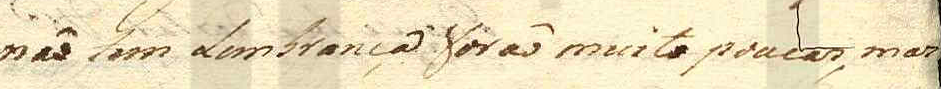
naõ tem Lembrança foraõ muito poucas, mas
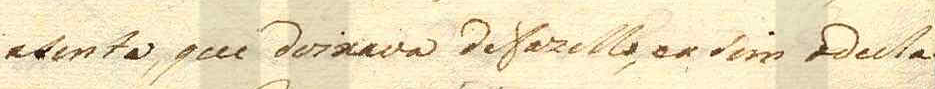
asenta, que deixava de fazello, e asim o decla
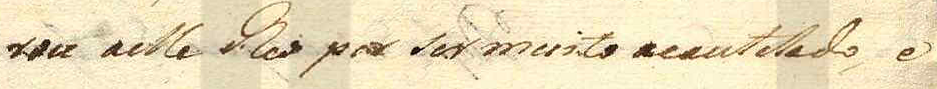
rou a elle Reo por ser muito acautelado, e
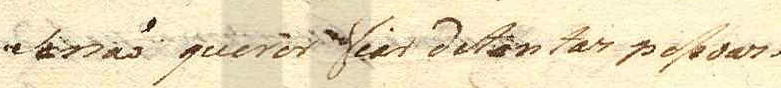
se naõ querer fiar de tantas pessoas.
